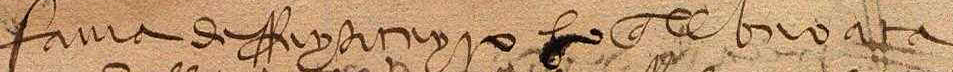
fama de ffeyticeyro ho q̄ll veo a ca
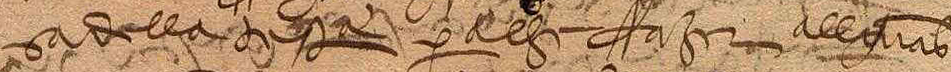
sa della testa ꝑa lhe ffazer allgūas
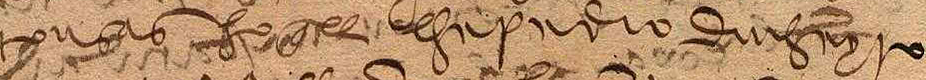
cousas o q̄ll lhe pedio dinheyro
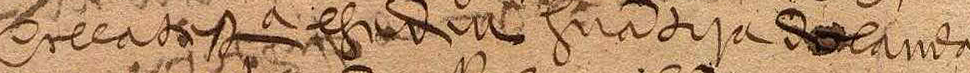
e ella testa lhe deu huā tira de olanda
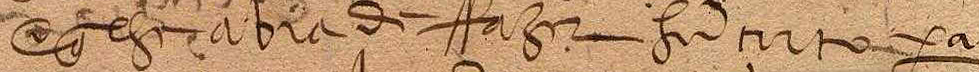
e q̄ lhe avia de ffazer hū circo ꝑa
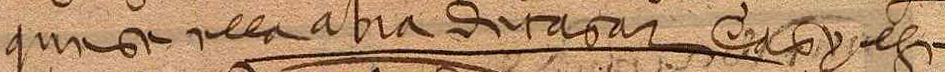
que se ella avia de casar e asy lhe
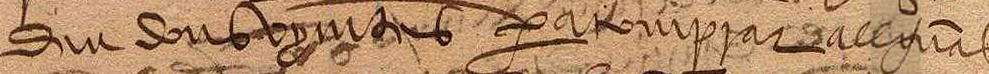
deu dous vymtes ꝑa comprar allgūas
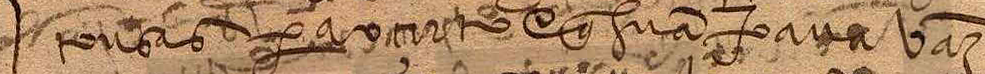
cousas ꝑa o circo e q̄ huā Joana vāz
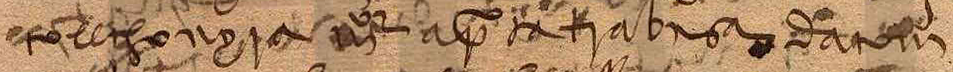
collchoeyra mor a p̄ota travesa da com
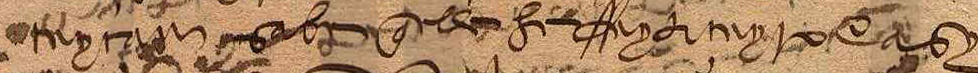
ceyçam sabe que elle he ffeyticeyro e asy
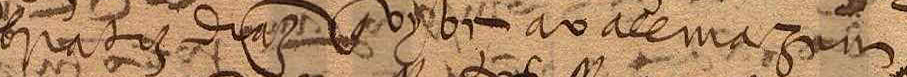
briatiz diaz q̄ vyve ao allmazem
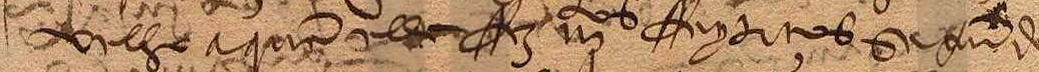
velho a quē elle ffez mtos ffeytiços segūdo
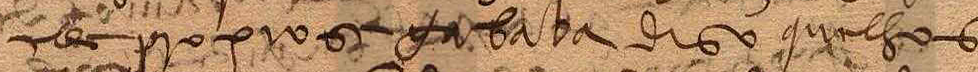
elle propio se gabada diso que lhos
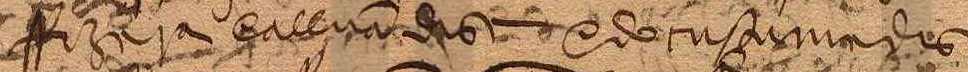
ffizera e all nā dise e do custume dise
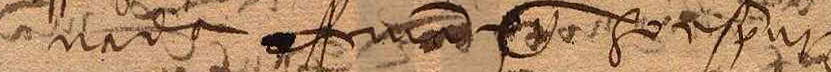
nada ffernā p̄iz ho esp̄uj
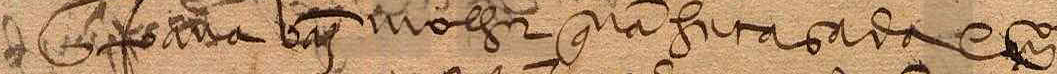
item Joana vāz molher q̄ nā he casada e mor
